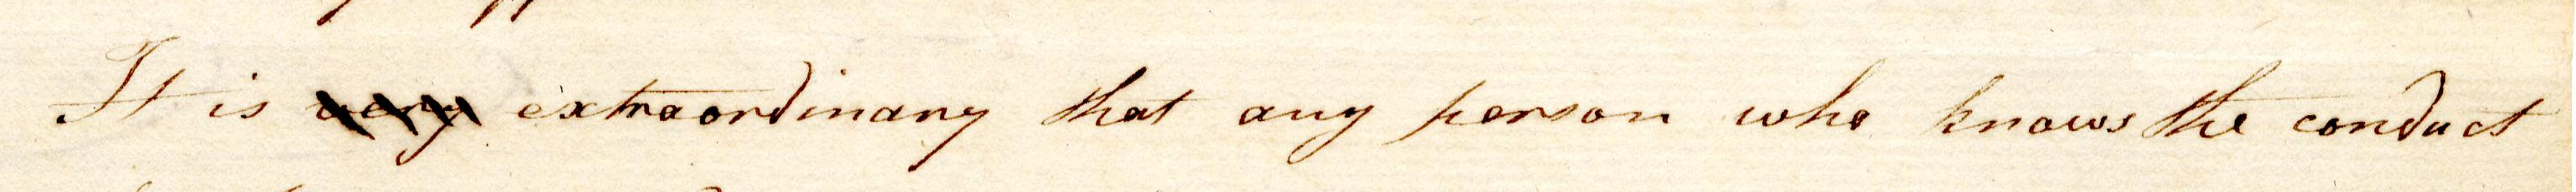It is very extraordinary that any person who knows the conduct
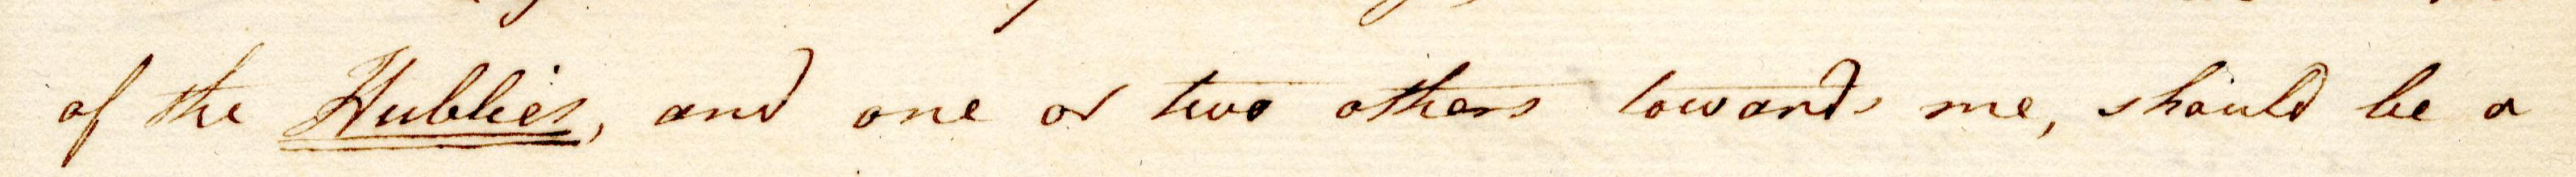of the Hublies, and one of two others towards me, should be a
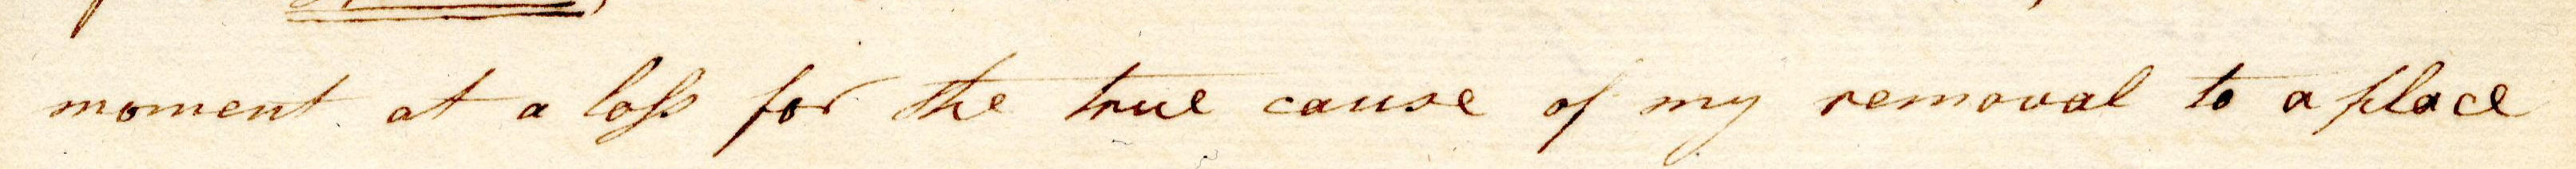moment at a loss for the true cause of my removal to a place
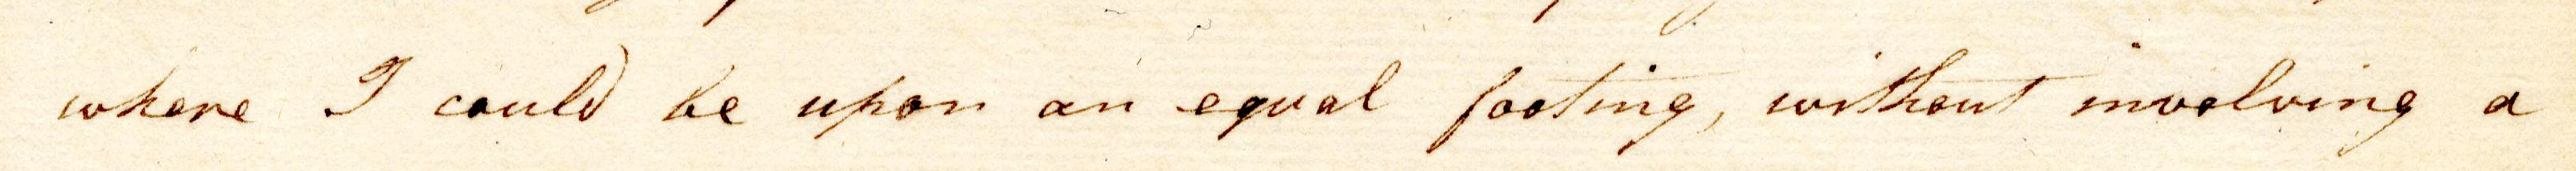where I could be upon an equal footing, without involving a
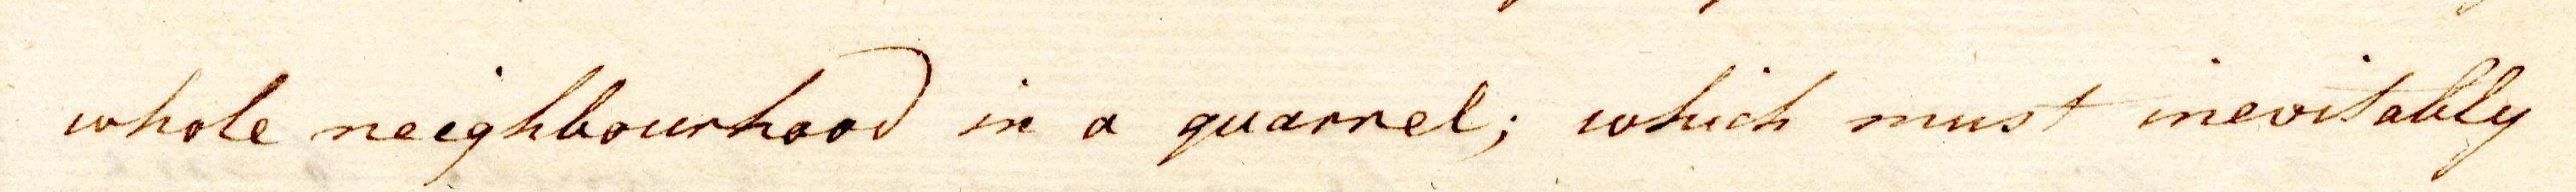whole neighbourhood in a quarrel; which must inevitably
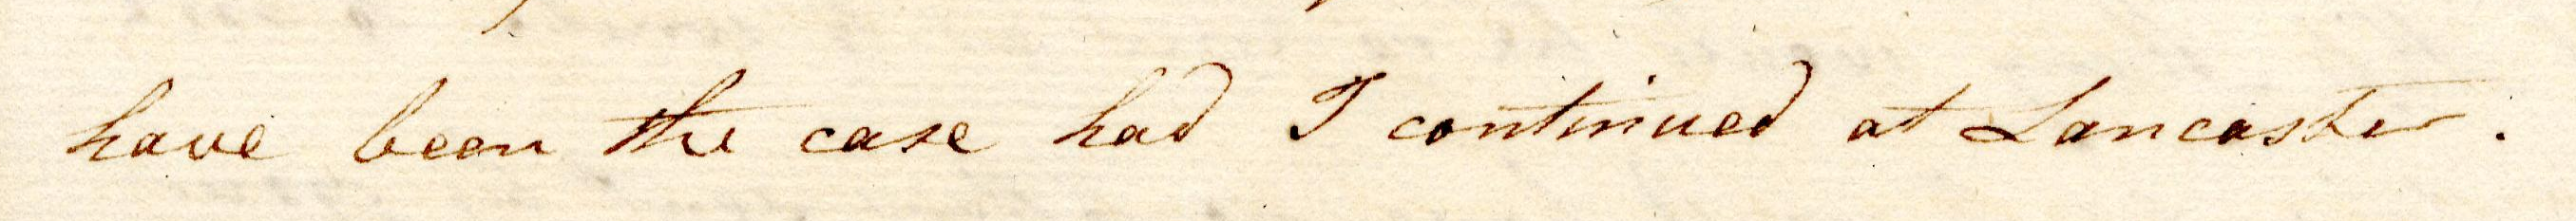have been the case had I continued at Lancaster.
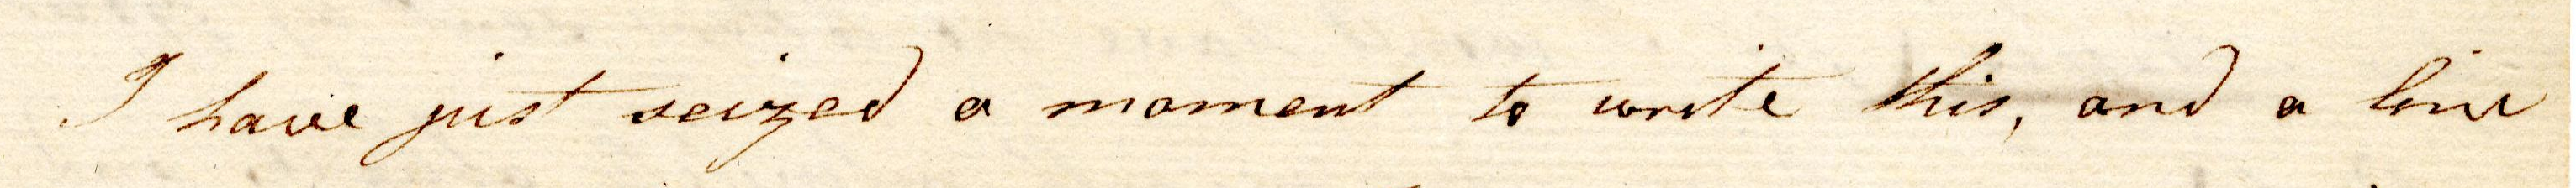I have just seized a moment to write this, and a line
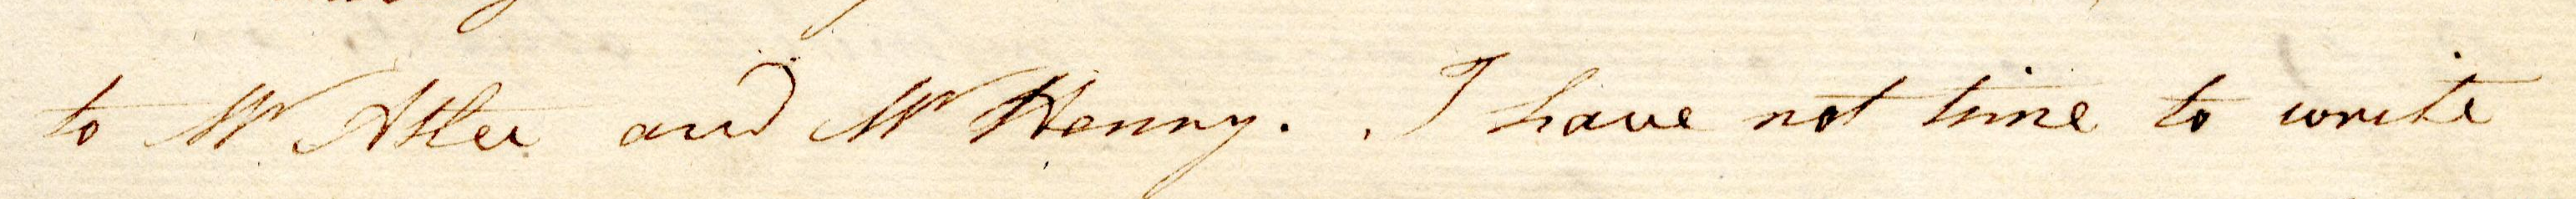to M^r Atlee and M^r Henry. I have not time to write
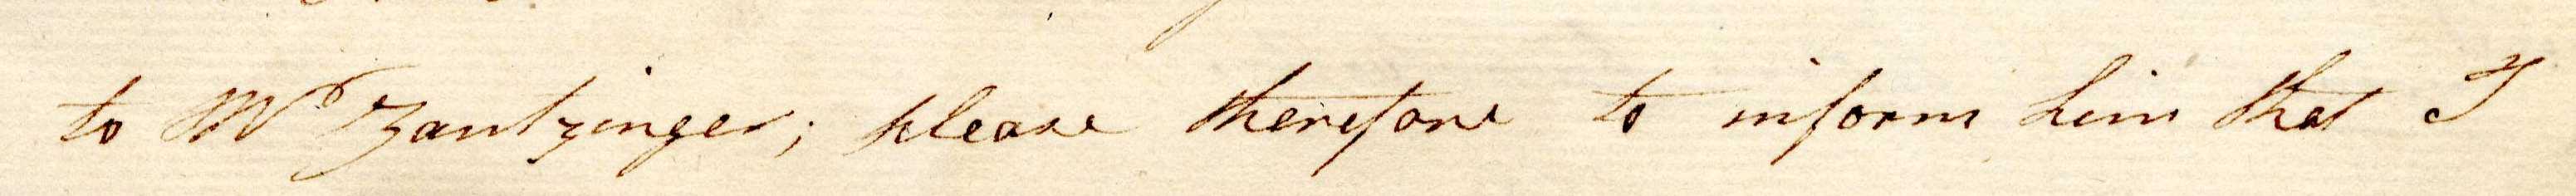to M^r Zantzinger; please therefore to inform him that I
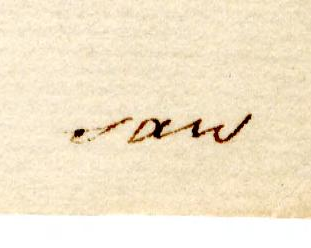saw
